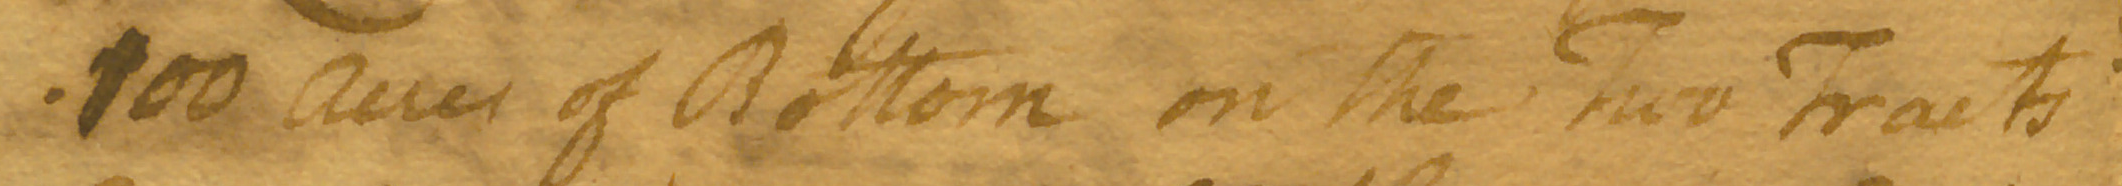100 acres of Bottom on the Two Tracts
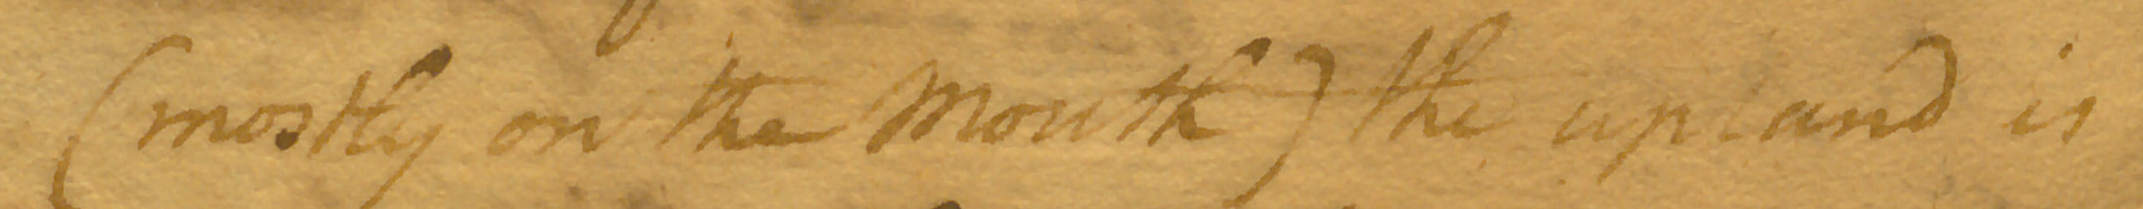(mostly on the mouth) the upland is
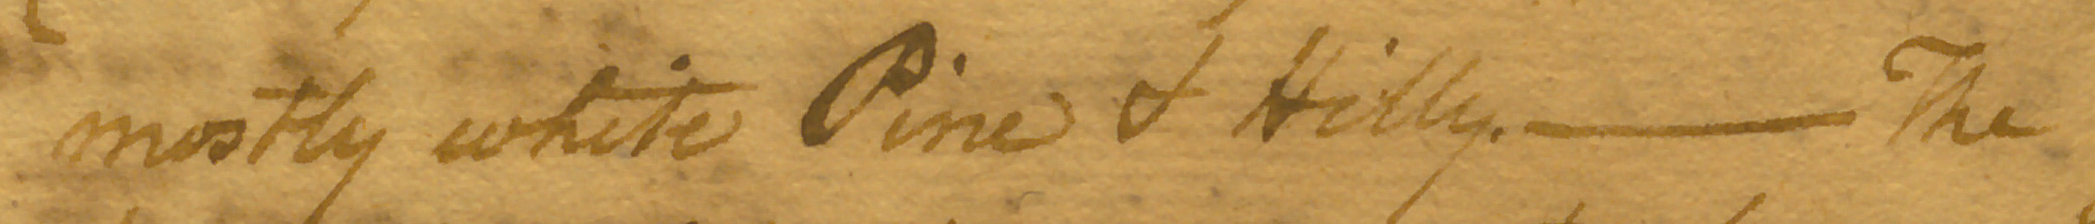mostly white Pine & Hilly.- The
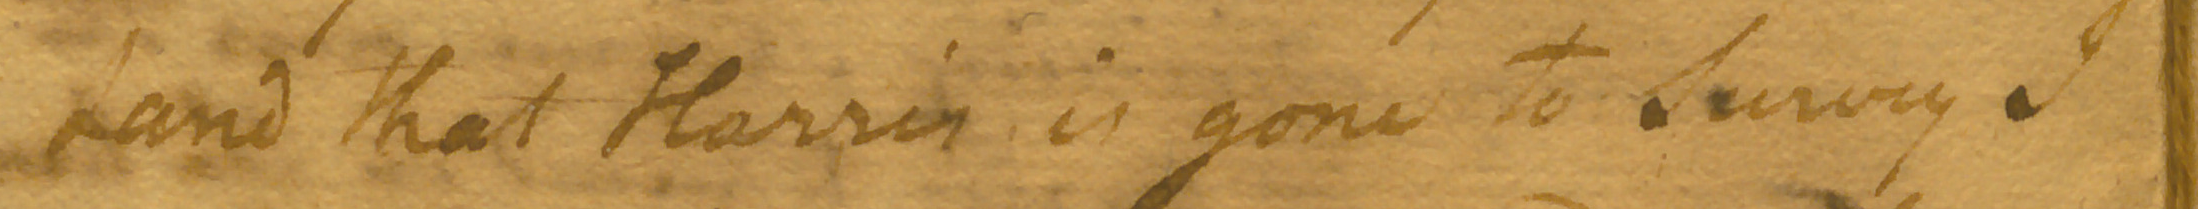Land that Harris is gone to Survey I
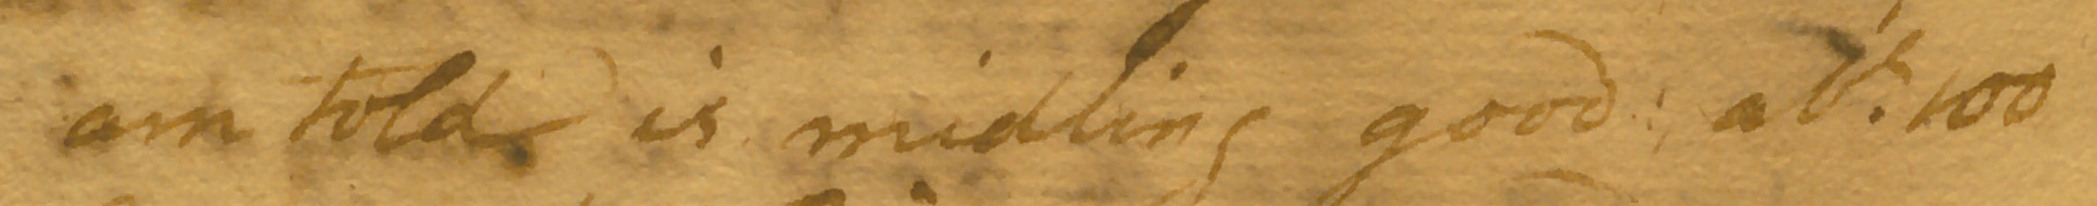am told is midling good ab^t. 100
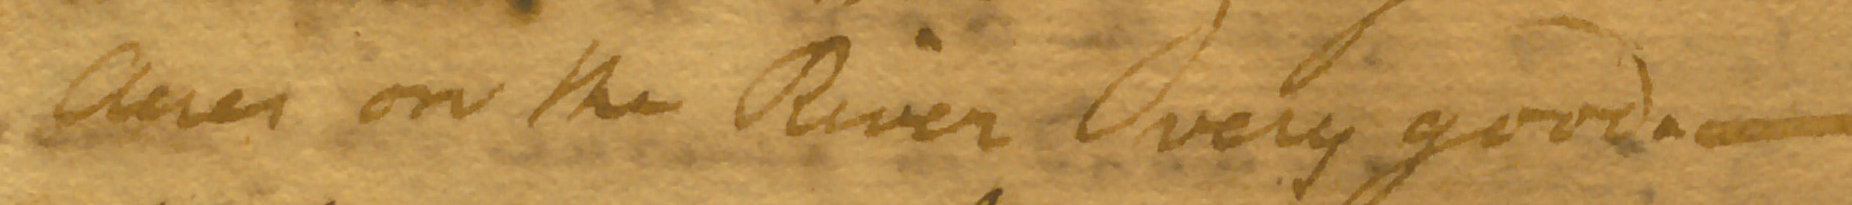Acres on the River very good.-
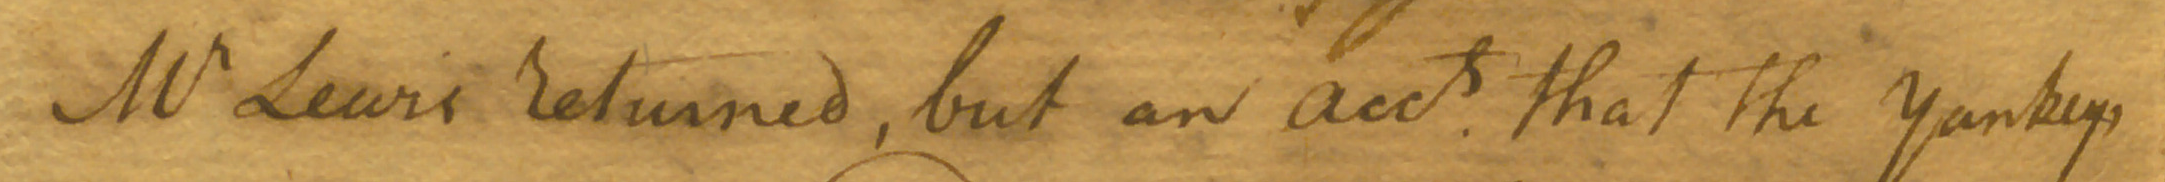M^r Lewis returned, but an acc^t. that the Yankeys
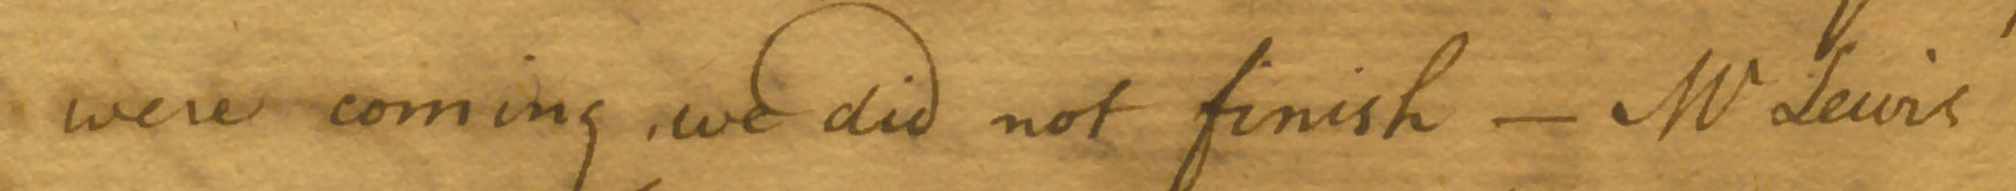were coming, we did not finish- M^r Lewis
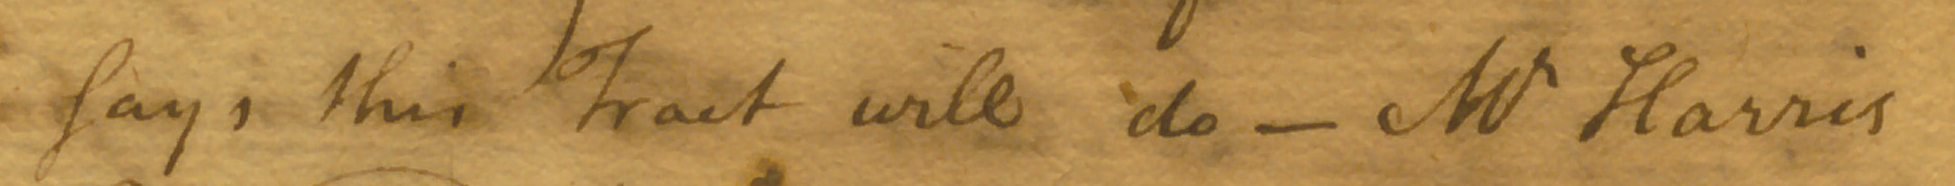says this Tract will do- M^r Harris
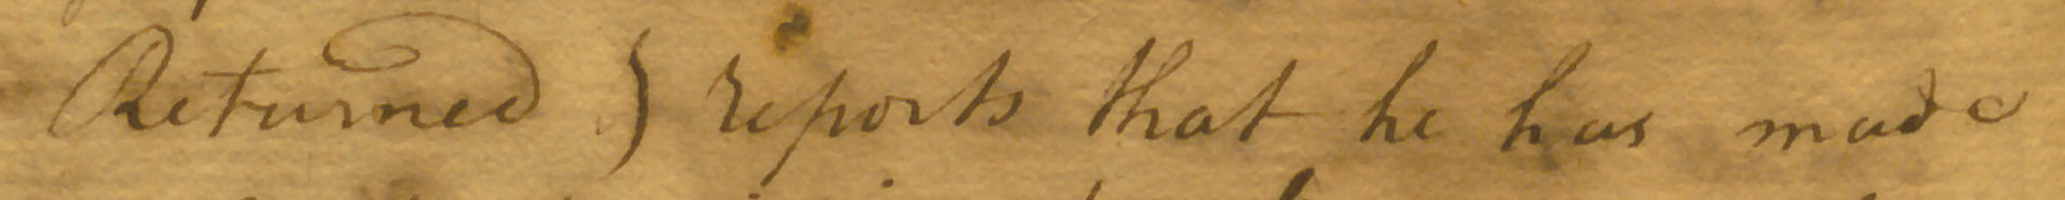Returned & reports that he has made
